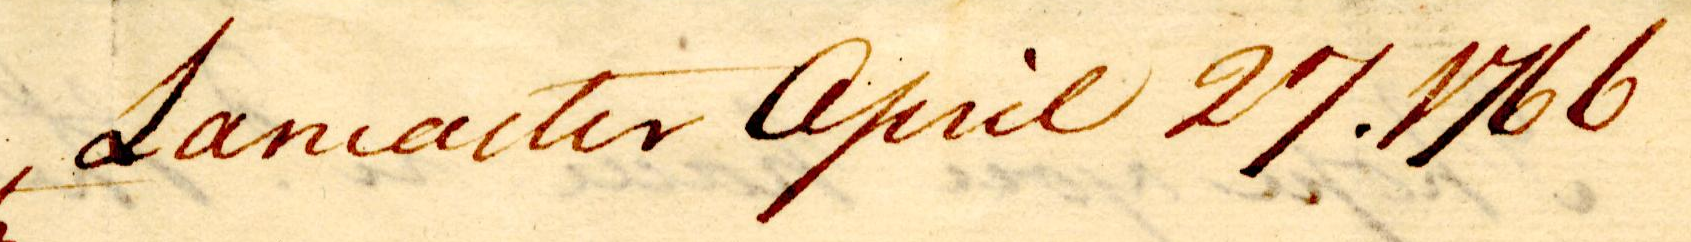Lancaster April 27. 1766
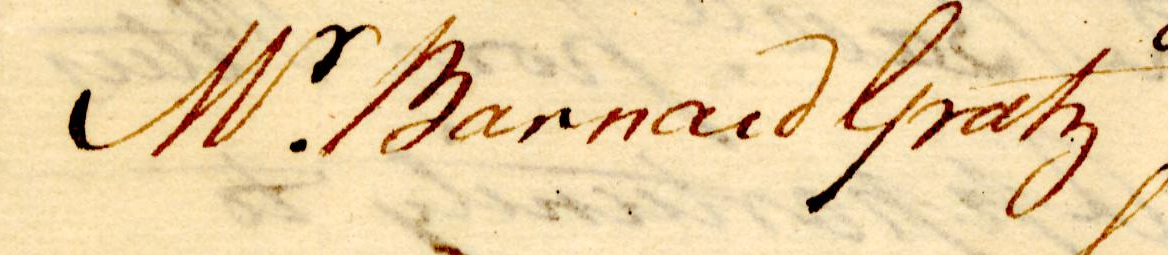M^r. Barnard Gratz
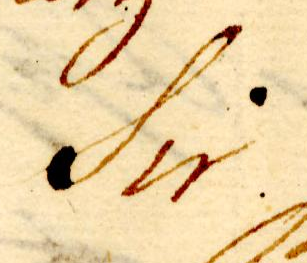Sir
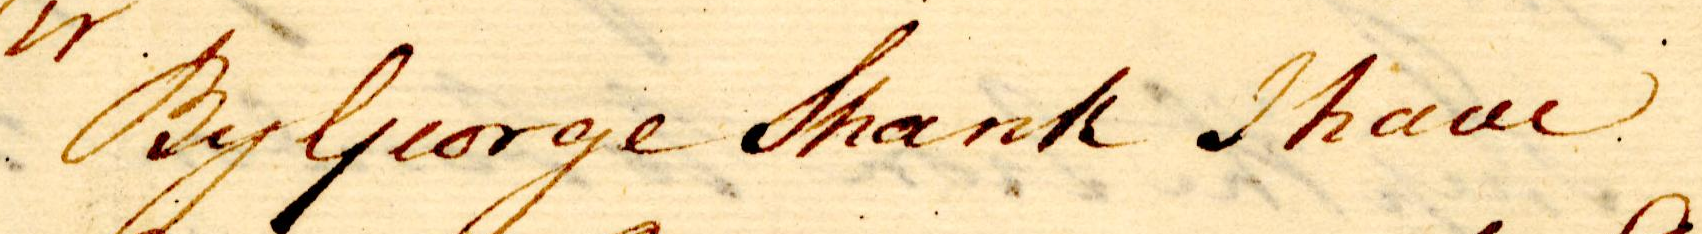By George Shank I have
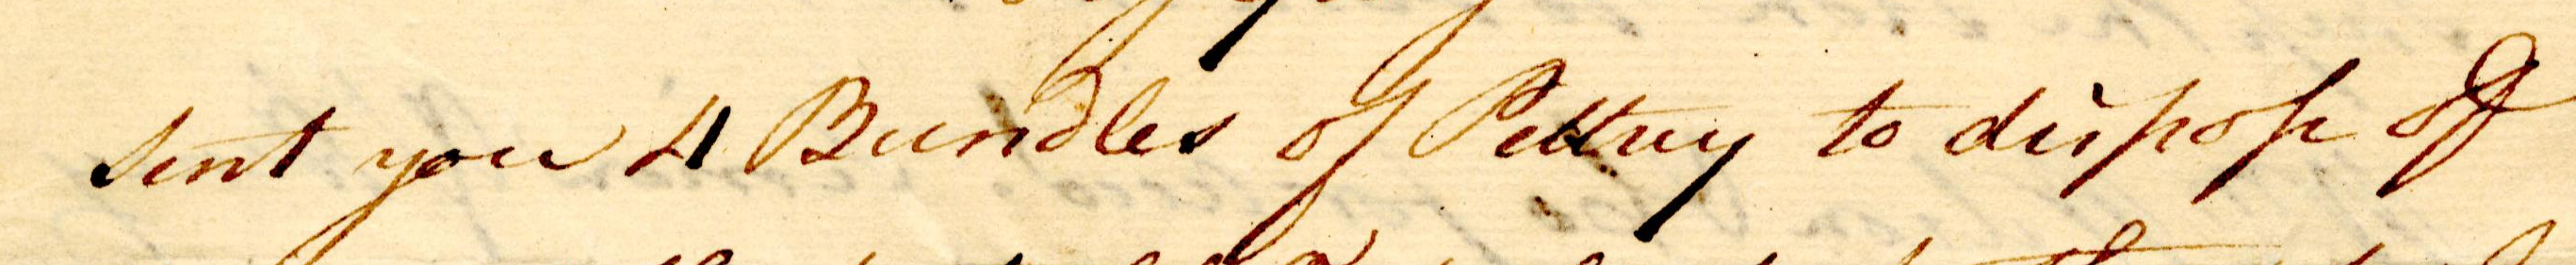sent you 4 Bundles of Pottry to dispose of
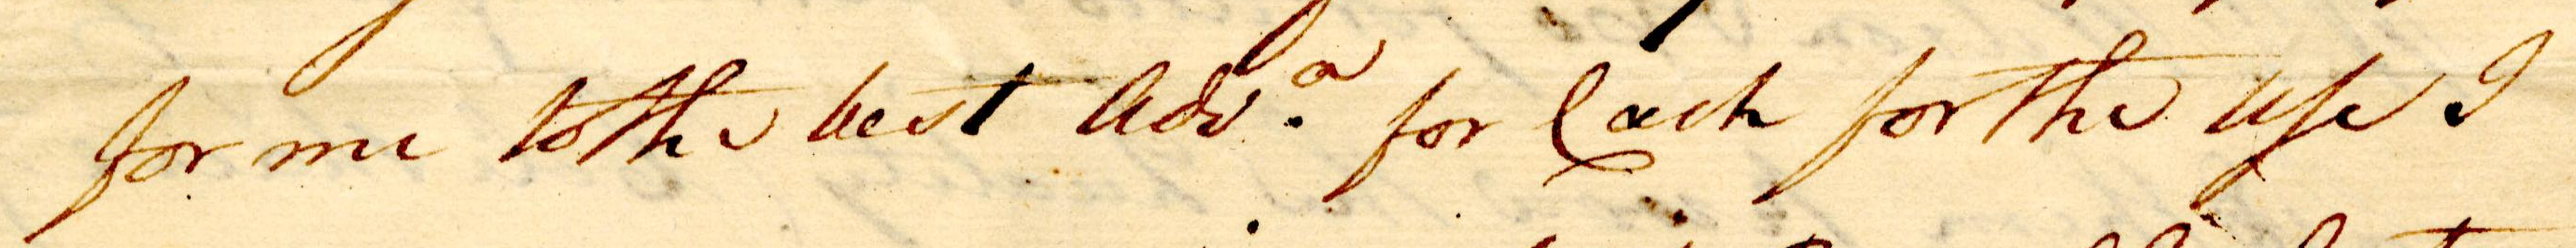for me to the best Adv^e. for Cash for the use I
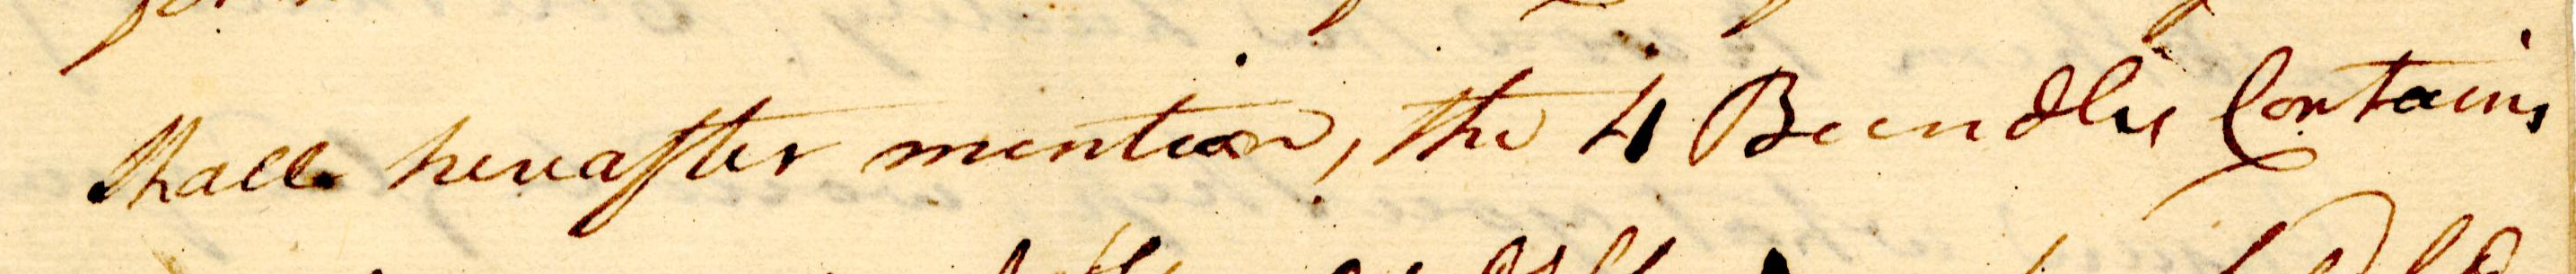Shall hereafter mention, the 4 Bundles Contain
